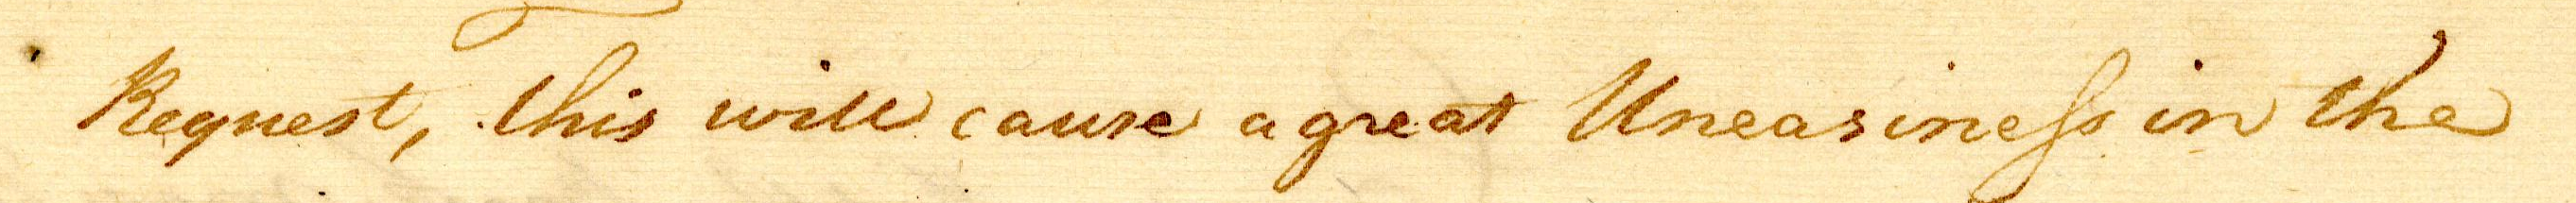Request, This will cause a great Uneasiness in the
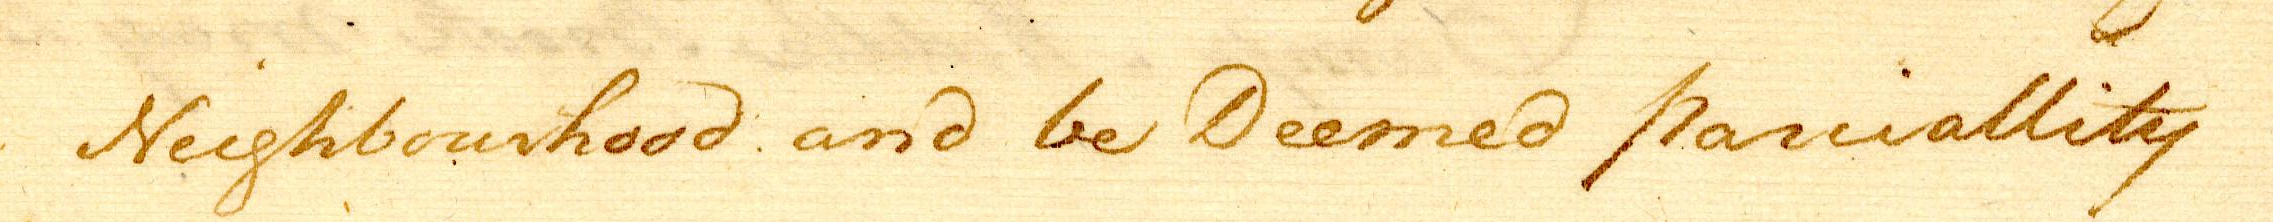Neighbourhood and be Deemed parciallity
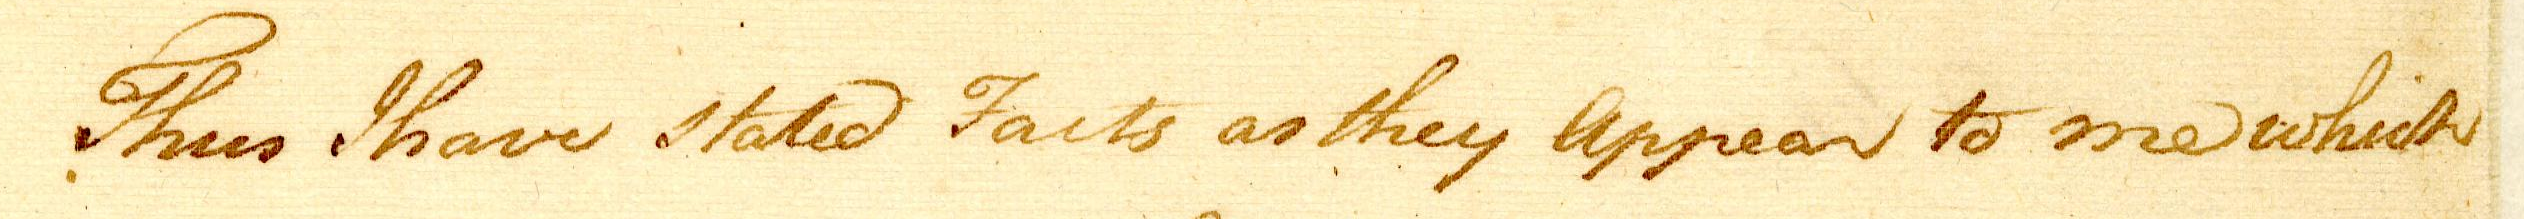Thus I have stated Facts as they Appear to me which
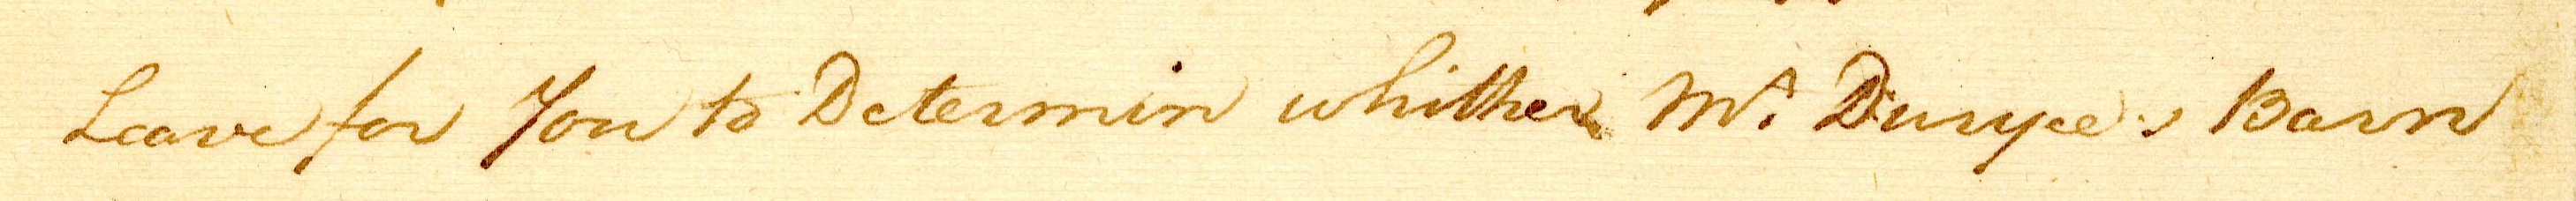Leave for You to Determin whither M^r. Duryee's Barn
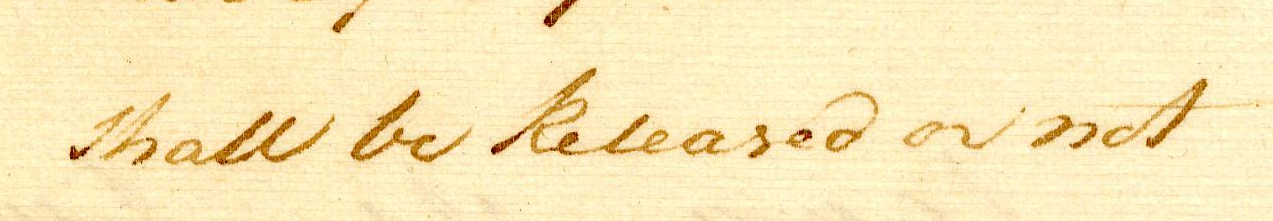shall be Released or not
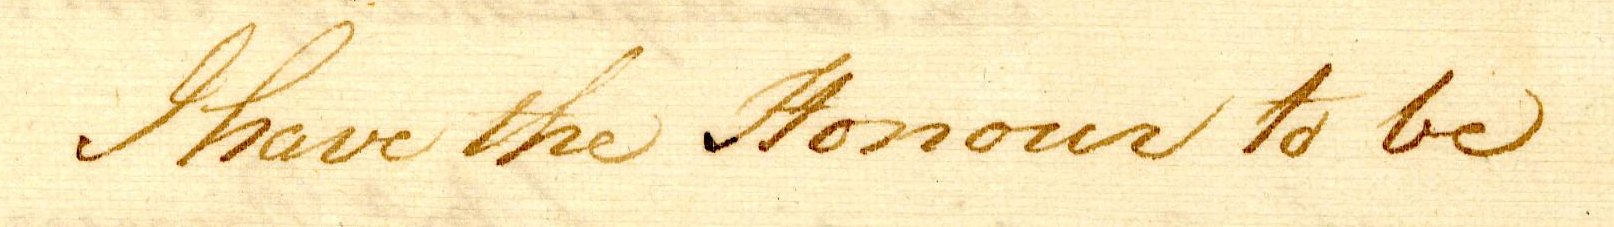I have the Honour to be
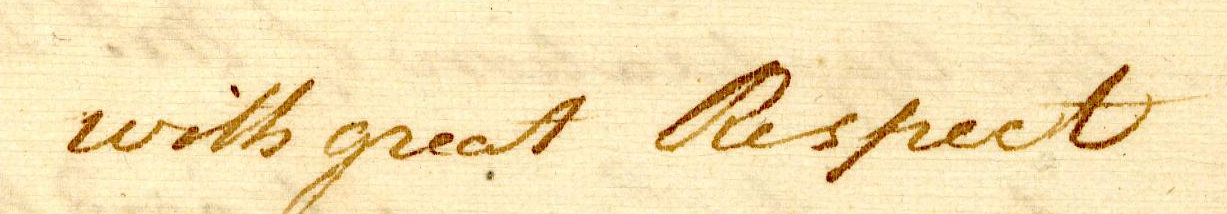with great Respect
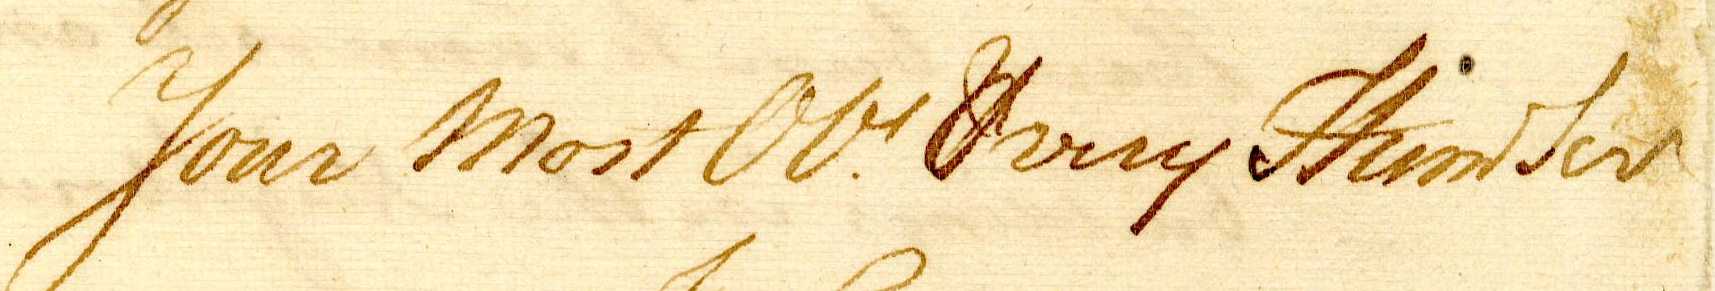Your Most Ob^t. & very Hum Ser
